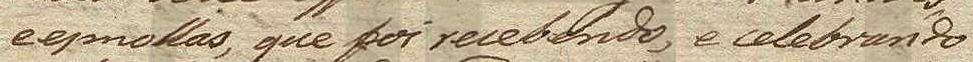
e esmollas, que foi recebendo, e celebrando
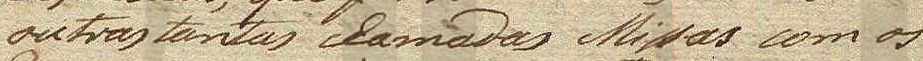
outras tantas chamadas Missas com os
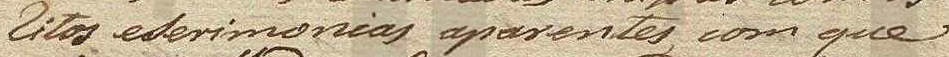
Ritos e serimonias aparentes, com que
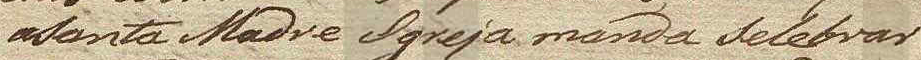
a santa Madre Igreja manda selebrar
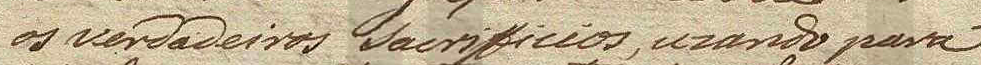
os verdadeiros sacrifficios, uzando para
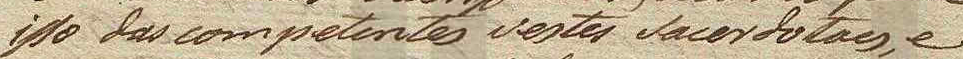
isso das competentes vestes sacerdotaes, e
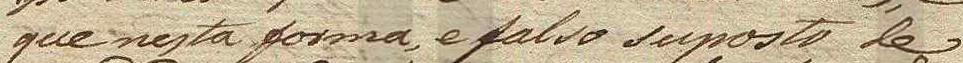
que nesta forma, e falso suposto de
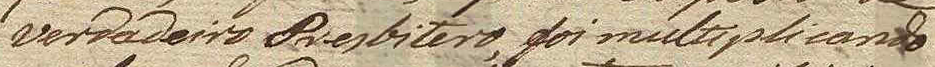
verdadeiro Presbitero foi multiplicando
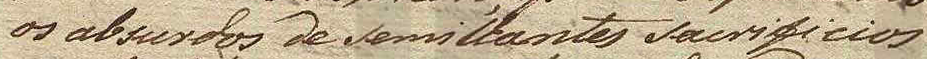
os absurdos de semilhantes sacrificios
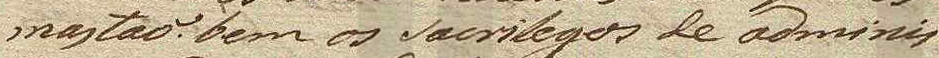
mas taõbem os sacrilegos de adminis
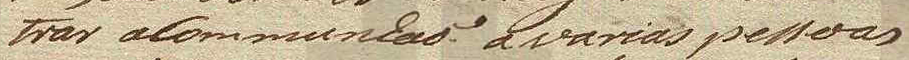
trar a Communhaõ a varias pessoas
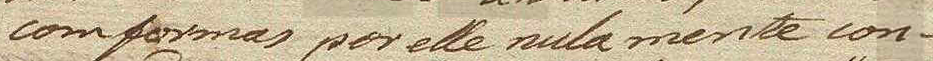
com formas por elle nulamente con
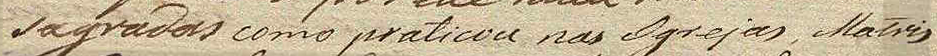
sagradas como praticou nas Igrejas Matris
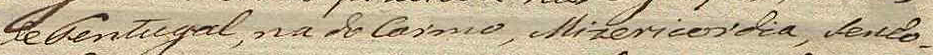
de Tentugal, na do Carmo, Misericordia, Senho
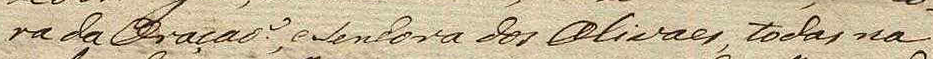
ra da Oraçaõ e Senhora dos Olivaes, todas na
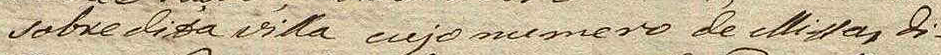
sobreditta villa cujo numero de Missas di
